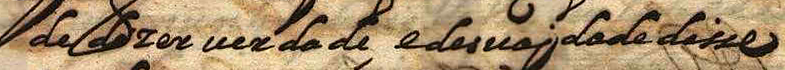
de dizer uerdade, e de sua idade disse
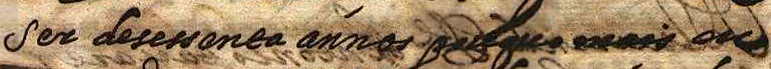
Ser de sessenta annos pouquo mais ou
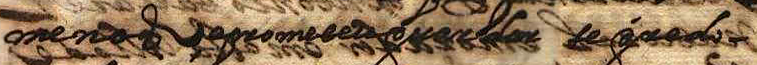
menos e prometeu guardar segredo.
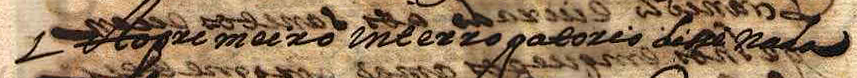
1 Ao primeiro interrogatorio disse nada
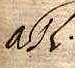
a R.
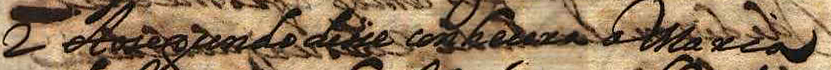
2 Ao segundo disse conhecera a R Maria
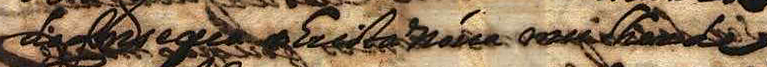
da fonsequa christã noua mulher de
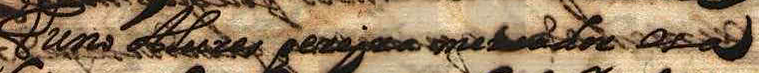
Nuno Alures pereira mercador e sa
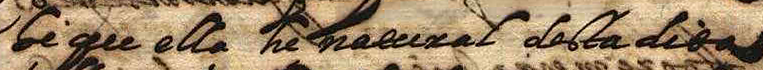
be que ella he natural desta dita
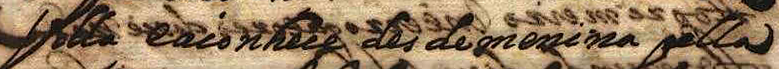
Villa e a conhece desde menina pella
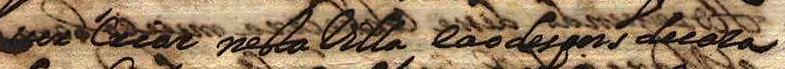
uer criar nesta Villa, e ao despois de caza
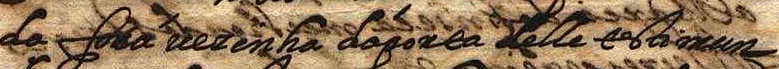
da fora uezinha da porta delle testemun
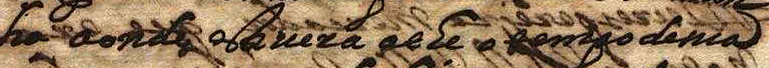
ha aonde estiuera athe o tempo de sua
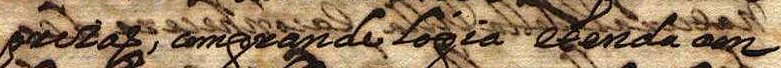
prizaõ, com grande Lógia e tenda aon
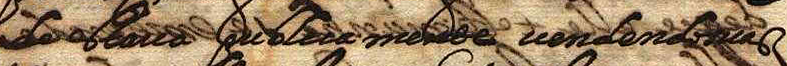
de estaua publicamente, uendendo suas
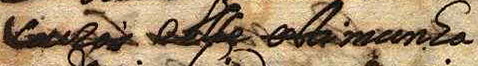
couzas e elle testemunha
